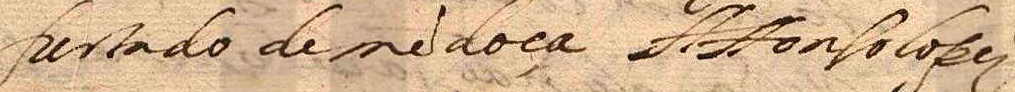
furtado de mēdoça Affonso lopez
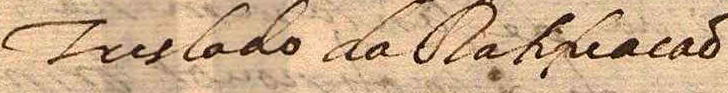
Treslado da Ratificacaõ
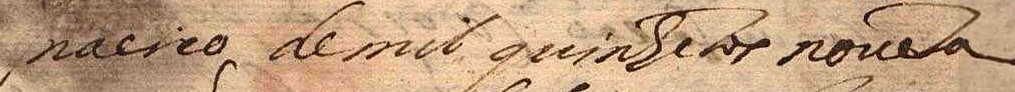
Jnaeiro de mil quinhētos nouēta
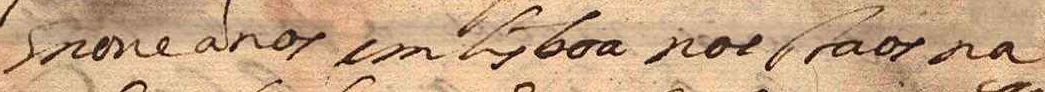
E noue ānos em lisboa no estaos na
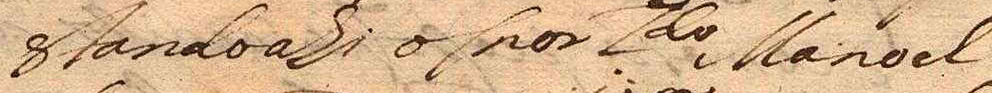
estando ahi o snor Ldo Manoel
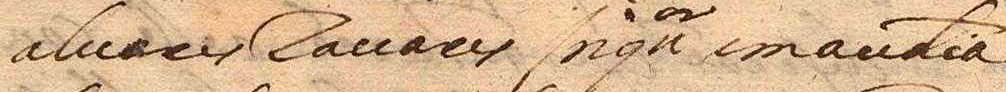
aluares Tauares Jnquor em audīa
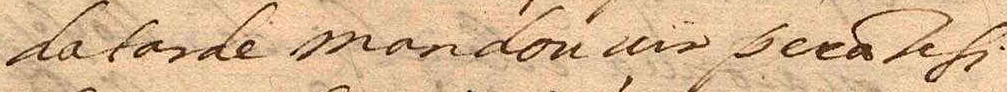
da tarde mandou uir perāte si
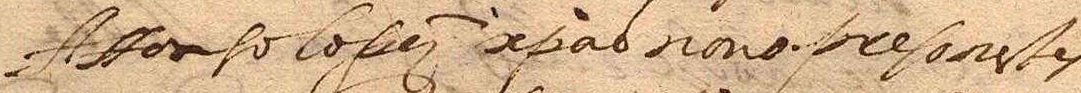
Affonso lopez xpaõ nouo preso nestes
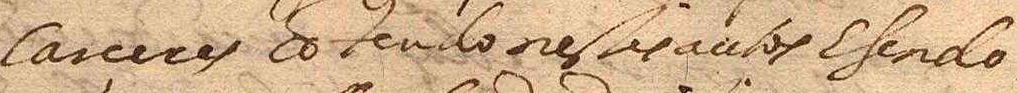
Carçeres cōteudo nestes autos E sendo
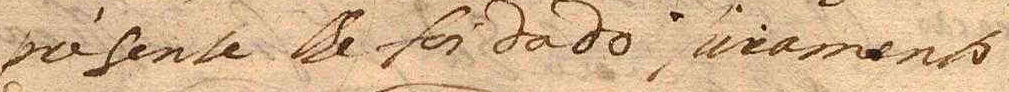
presente lhe foi dado Juramento
